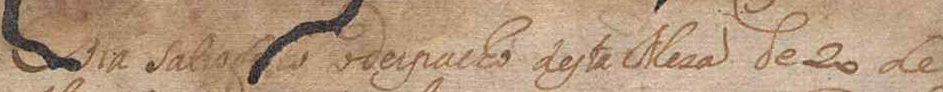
Esta satisf to o despacho desta Meza de 20 de
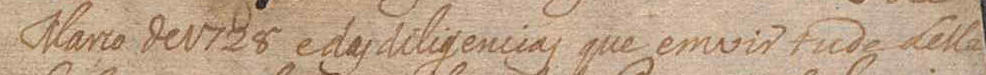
Março de 1728 e das diligencias que em virtude delle
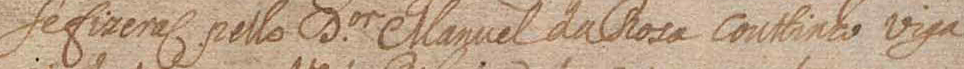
se fizeraõ pello D.or Manuel da Roza Couttinho viga
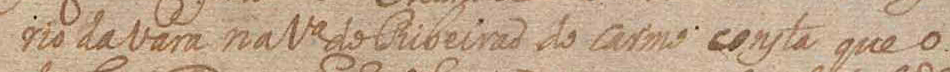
rio da vara na Va do Ribeiraõ do carmo consta que o
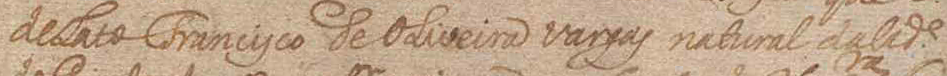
deLato Francisco de OLiveira vargas natural da Cid.e
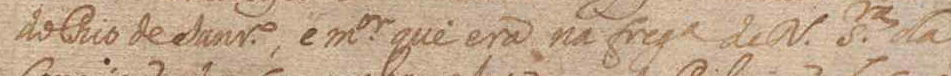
do Rio de Ianr.o, e m.or que era na frega de N. S.ra da
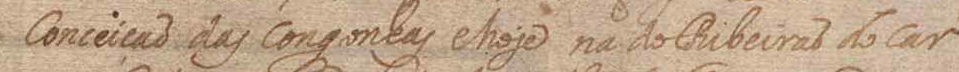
Conceiçaõ das Congonhas e hoje na do Ribeiraõ do car
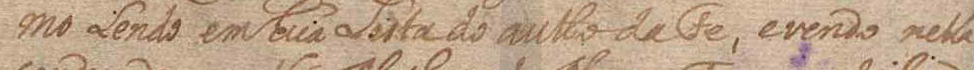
mo Lendo em huā Lista do autto da Fe, e vendo nella
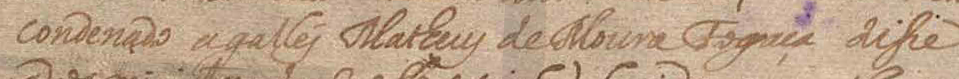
condenado a gallés Matheus de Moura Fogaça disse
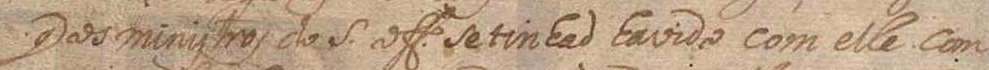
q̄ os ministros do s. off.o se tinhaõ havido com elle com
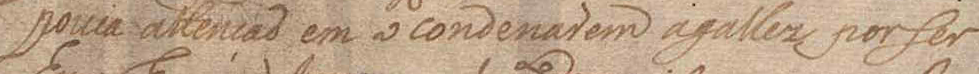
pouca attençaõ em o condenarem a gallez por ser
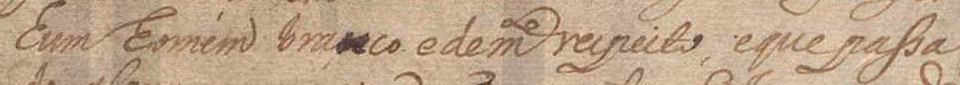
hum homem branco e de mto respeito, e que passa
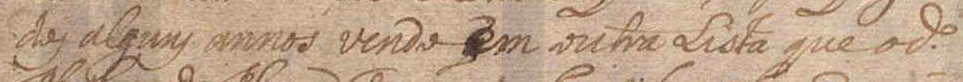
dos alguns annos vendo em outra Lista, que o d.o
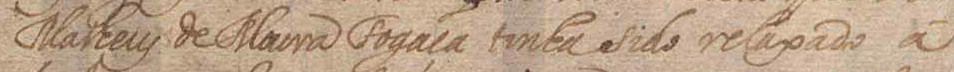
Matheus de Moura Fogaça tinha sido relaxado á
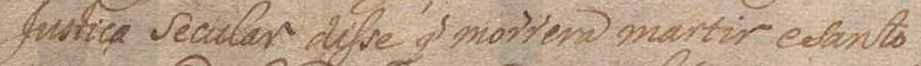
Justiça Secular disse q̄ morrera martir e santo
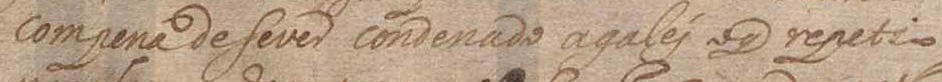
com pena de se ver condenado a galés o q̄ repetio
